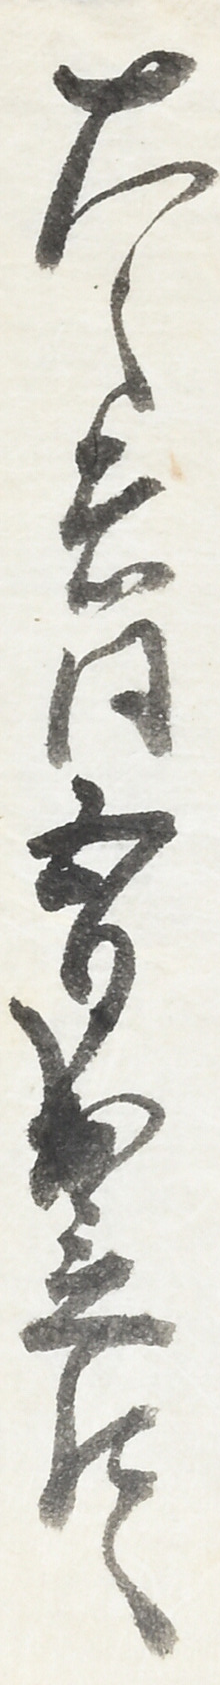右之者同五日出立仕候

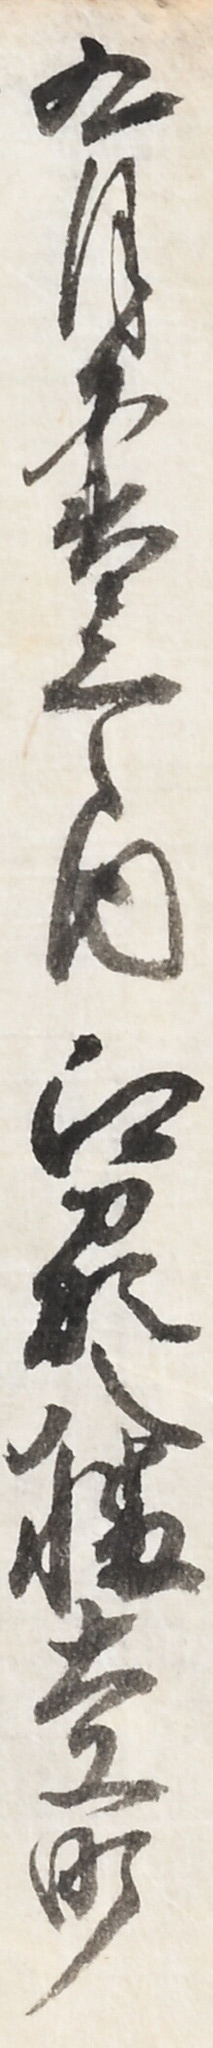九月書上之内江州八幡大工町
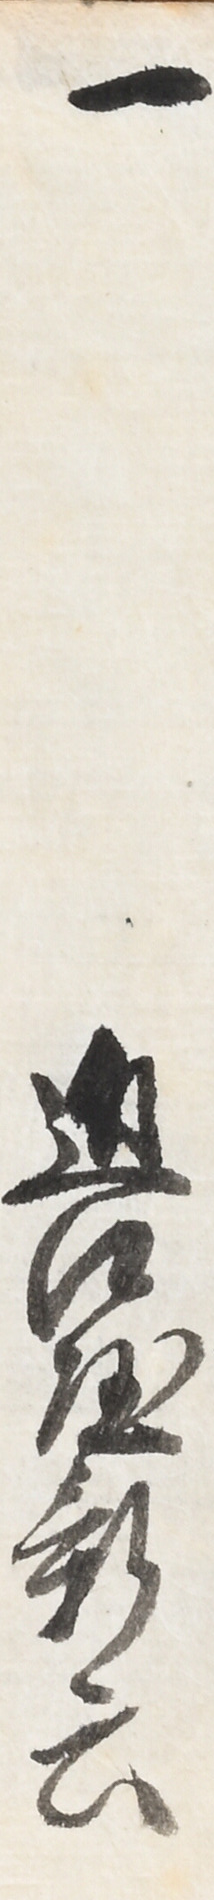一近江屋新六
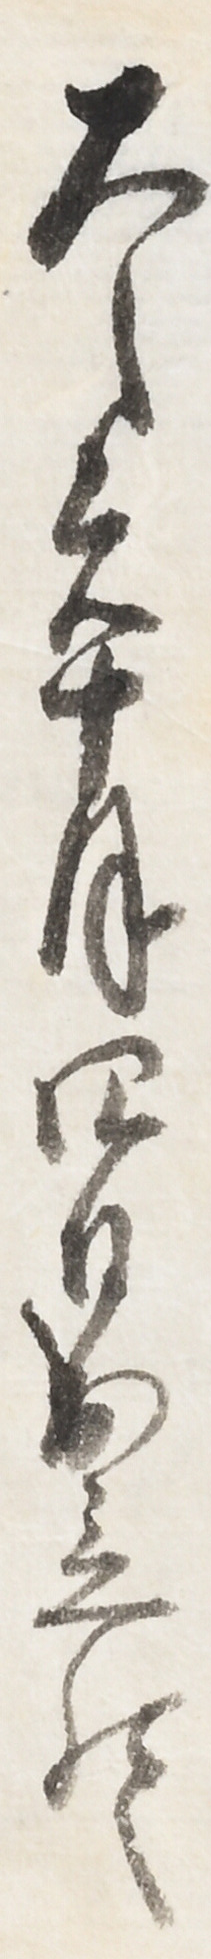右之者十月四日出立仕候
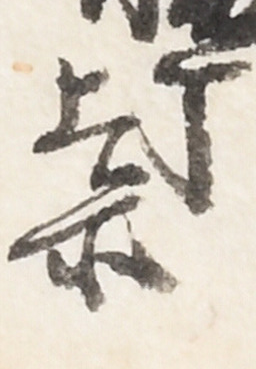上ル所
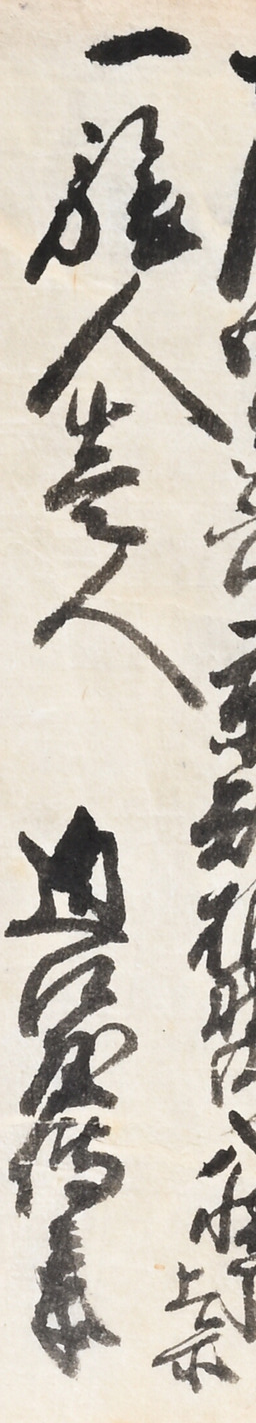一旅人壱人近江屋伝兵衛
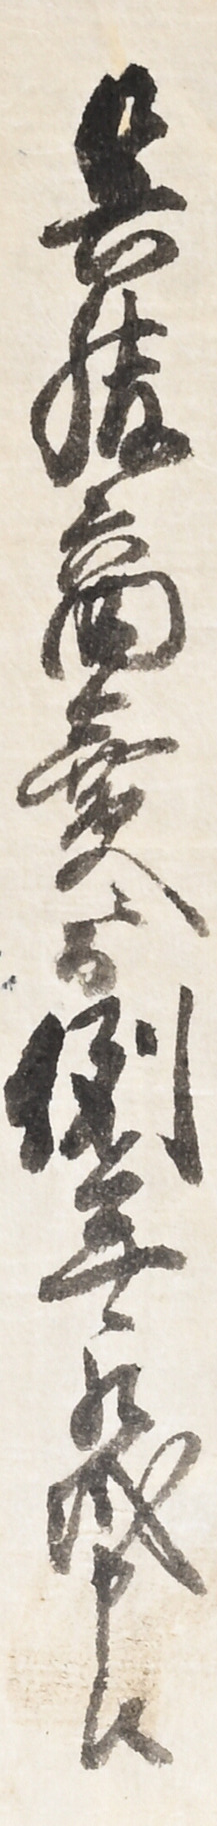呉服商売ニ而例年罷越申候
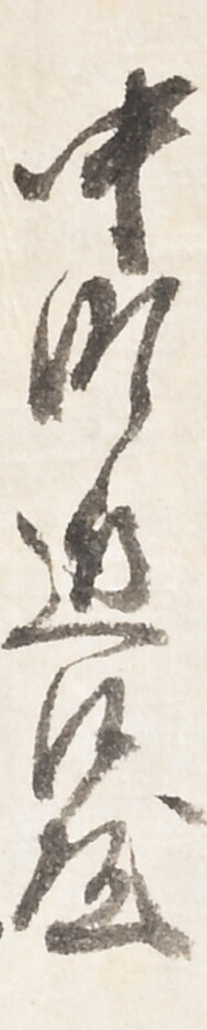中町近江屋
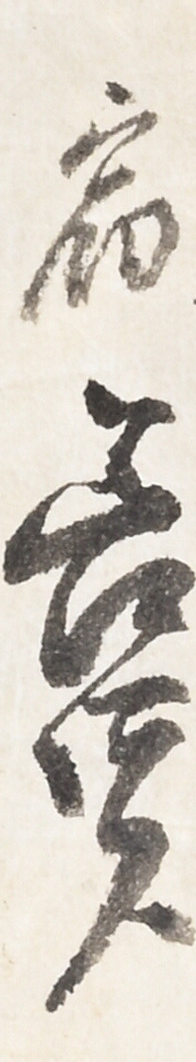宿善四郎
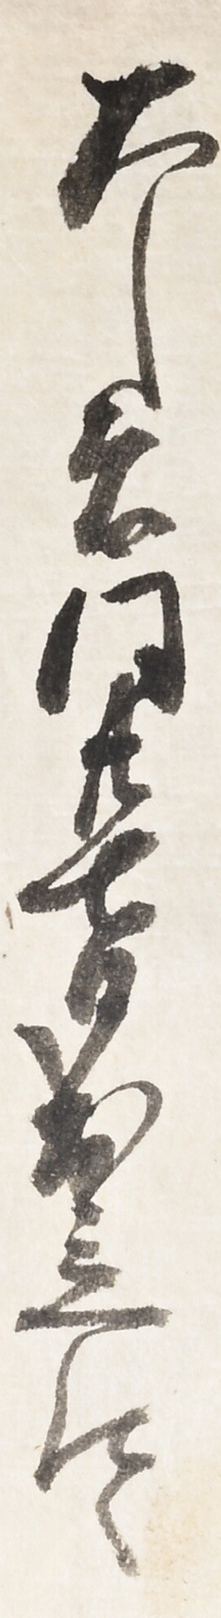右之者同廿七日出立仕候
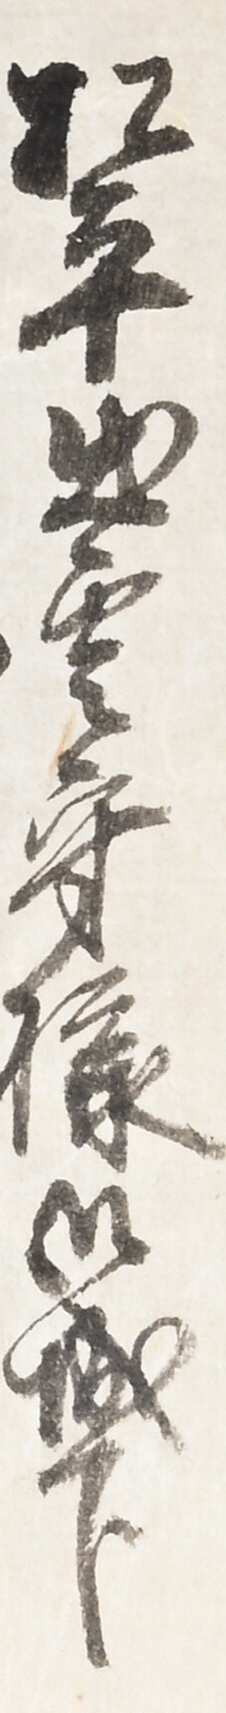松平出雲守様御城下
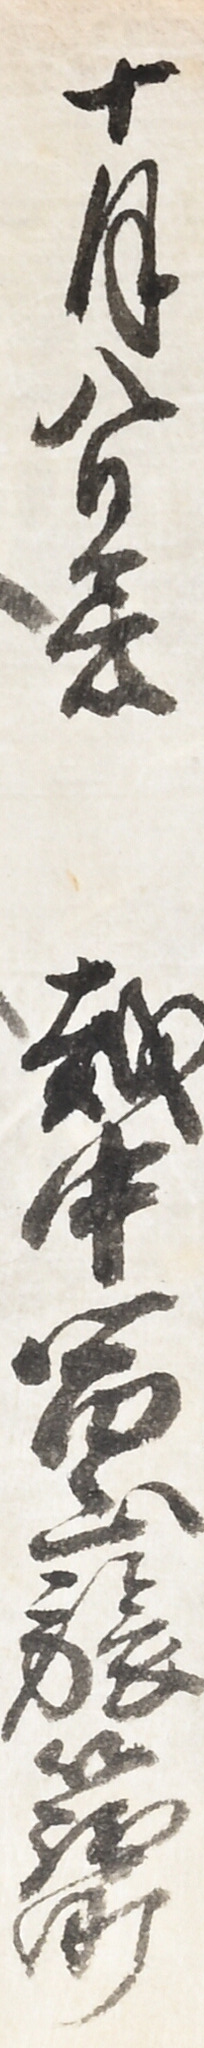十月八日着越中富山旅籠町
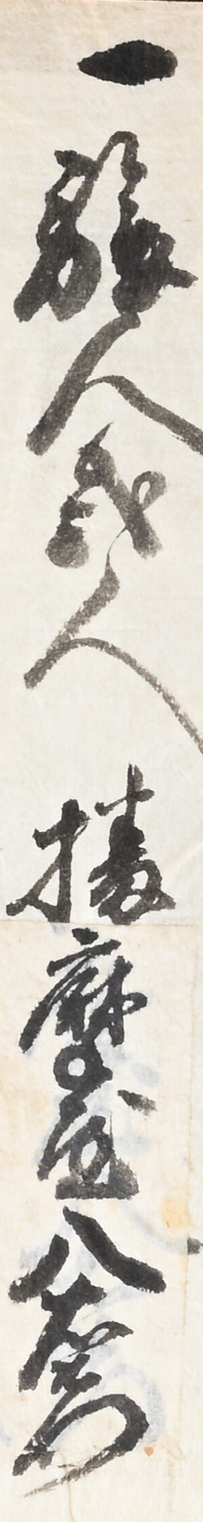一旅人弐人播磨屋八右衛門
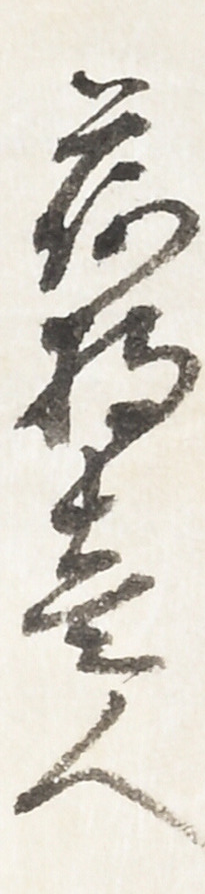荷持壱人
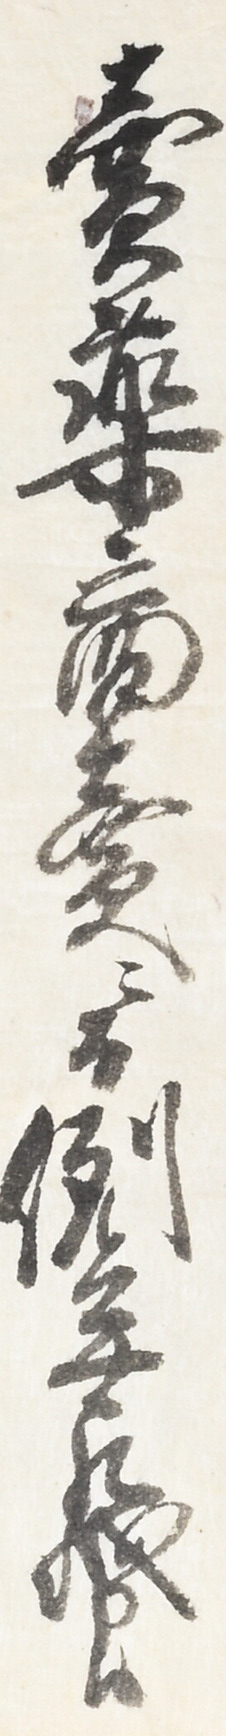売薬商売ニ而例年罷越申候
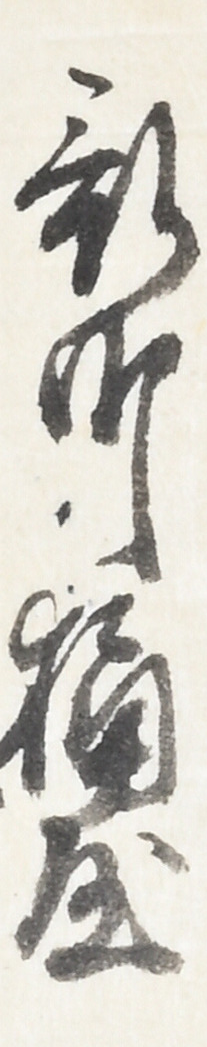新町桶屋
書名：旅人泊控帳
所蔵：伊那市立高遠町図書館・合同会社AMANE
